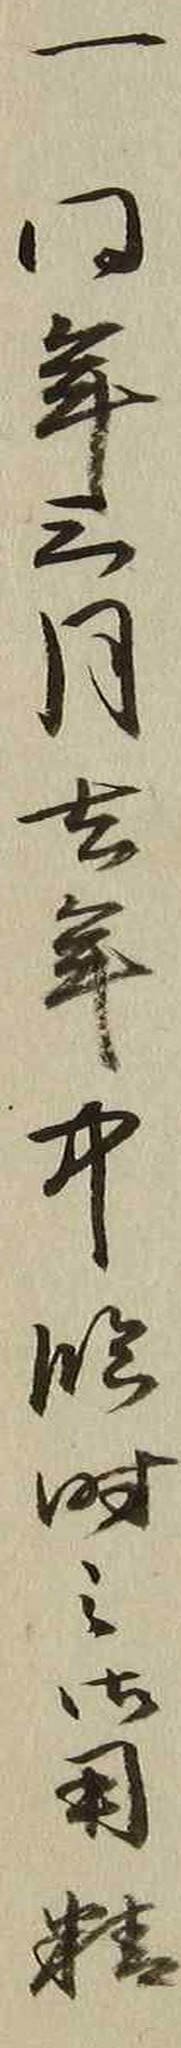一同年三月亥年中臨時之御用精
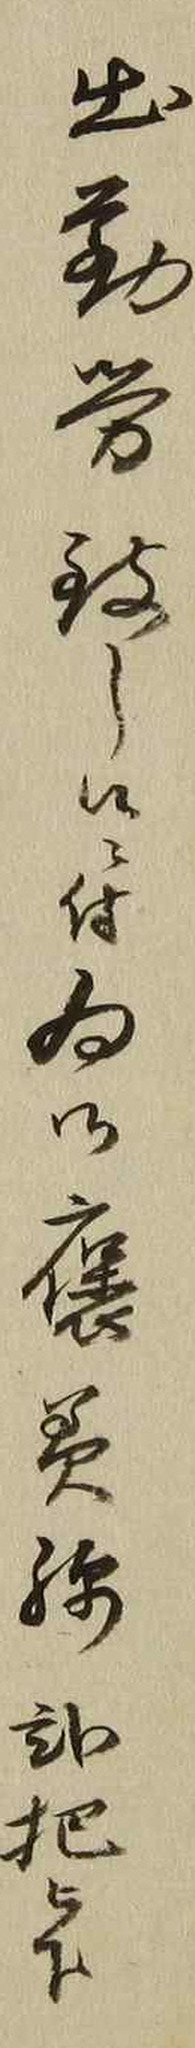出勤労致し候ニ付為御褒美錦弐把被下
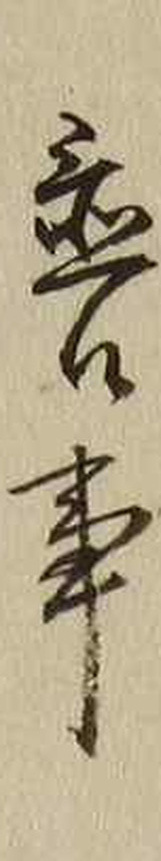置候事
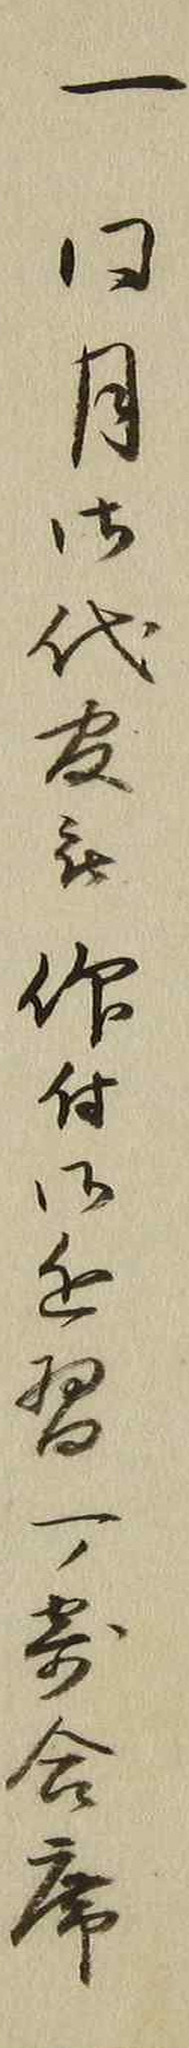一同月御代官被仰付御近習一ノ寄合席
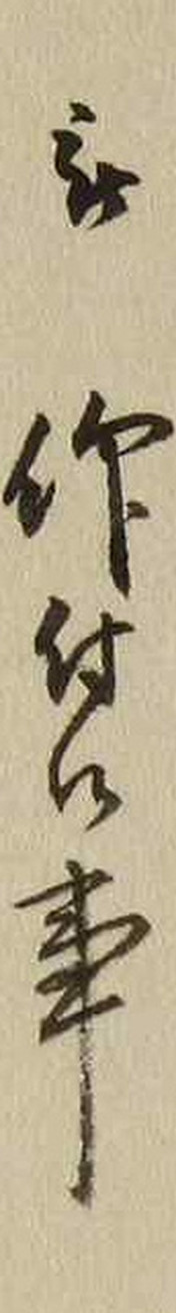被仰付候事
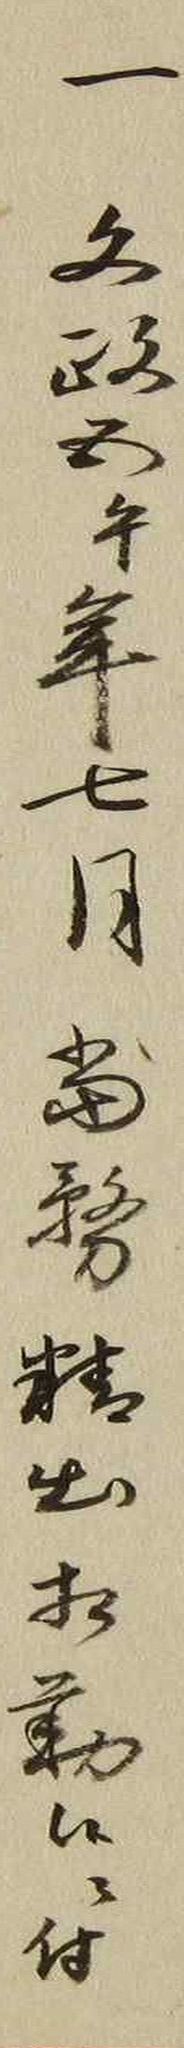一文政五午年七月当務精出相勤候ニ付
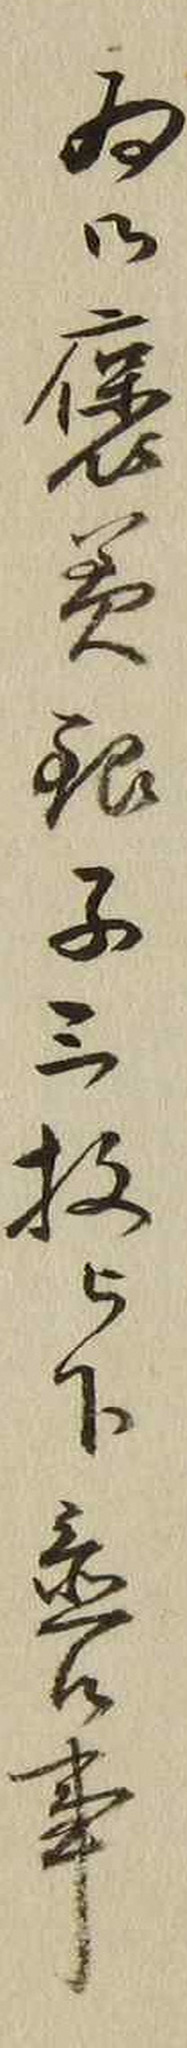為御褒美銀子三枚被下置候事
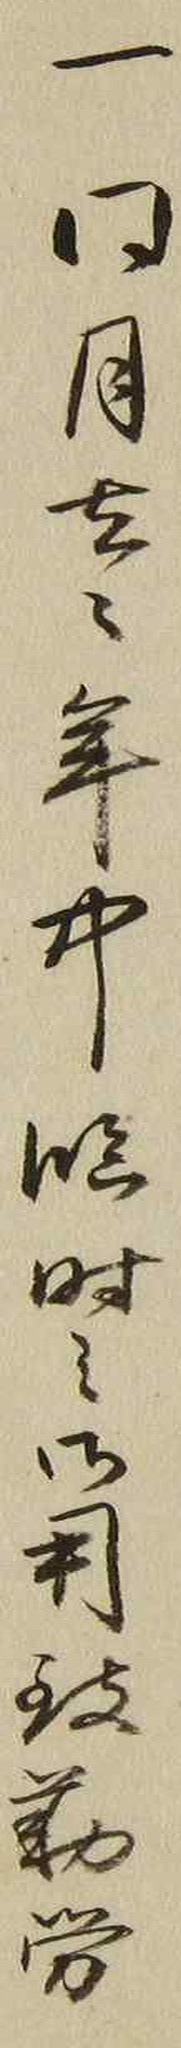一同月去々年中臨時之御用致勤労
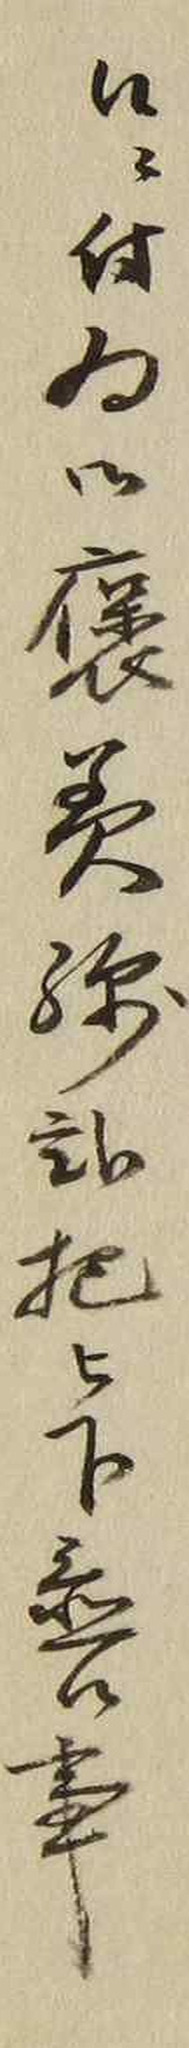候ニ付為御褒美綿弐把被下置候事
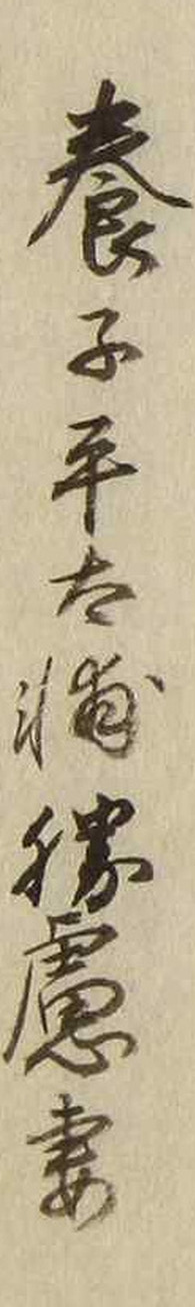女養子平太輔勝慮妻

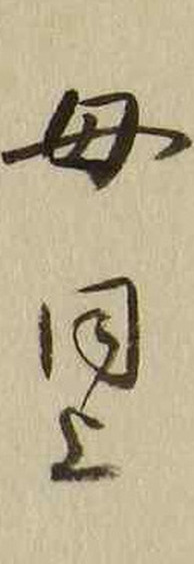母同上
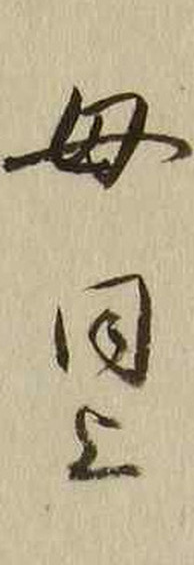母同上
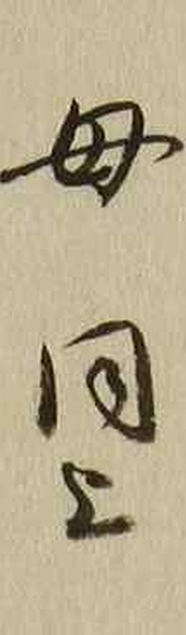母同上
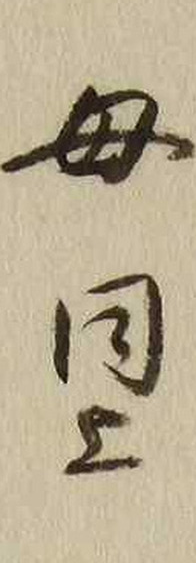母同上
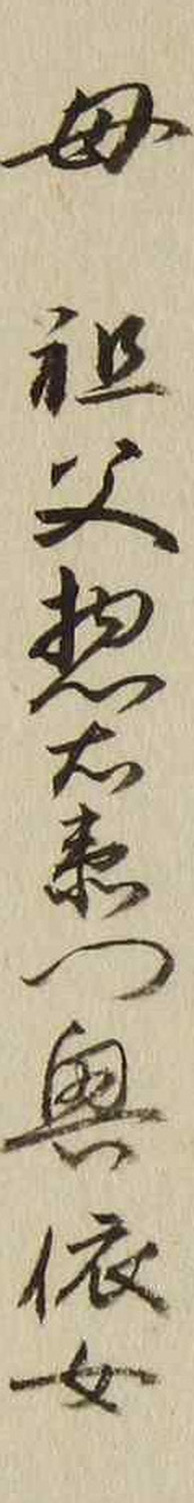母祖父惣右衛門興依女
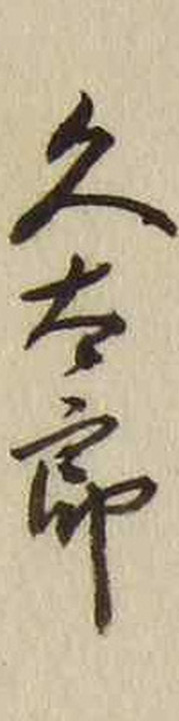久太郎
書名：諸士系譜　巻之128　た之部4
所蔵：会津若松市立会津図書館
